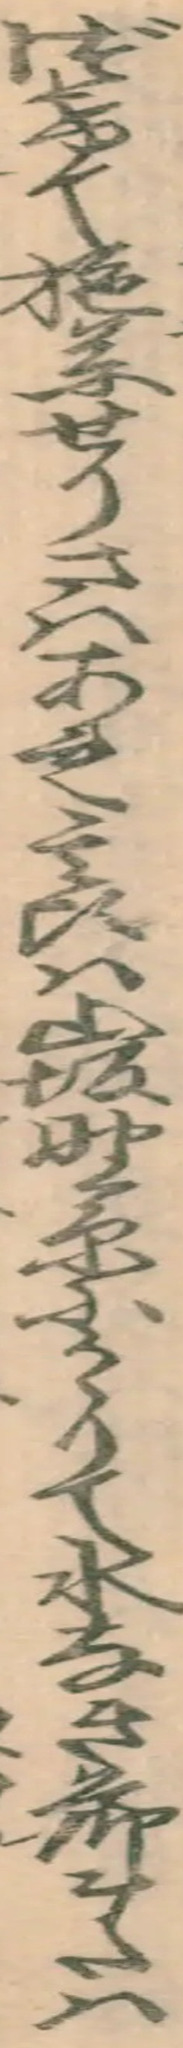づけて施薬せりさはあれ其頃は山坂野原にかゝりて水なき節または
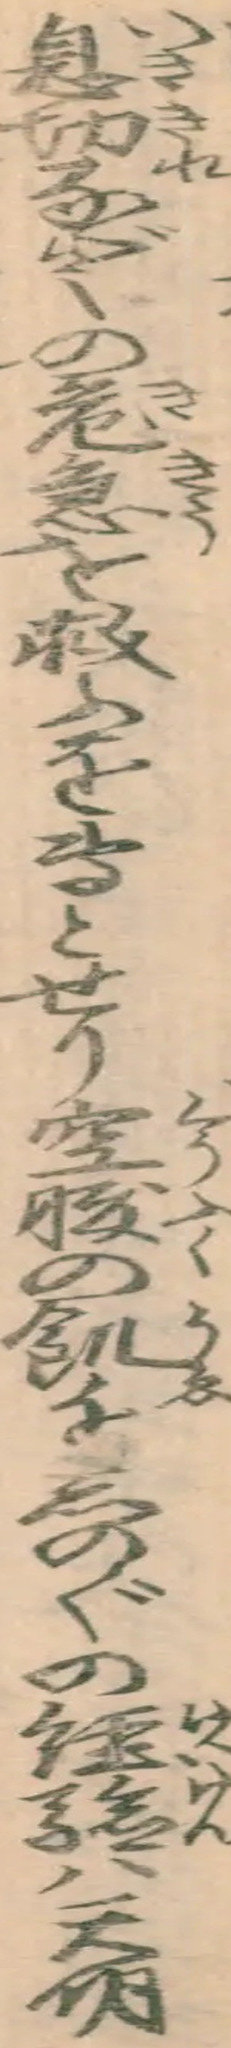息切などの危急を救ふを専とせり空腹の飢をしのぐの経験は天明
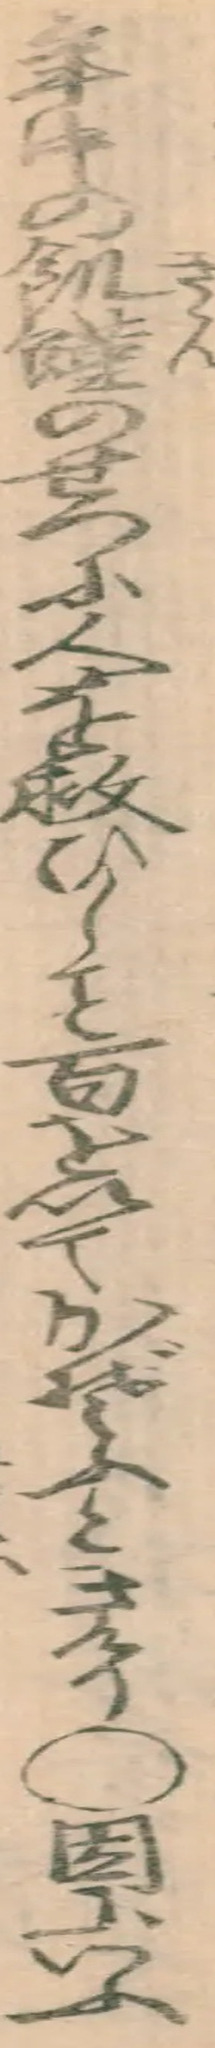年中の飢饉のせつに人を救ひしこと百を以てかぞふときけり○因にいふ
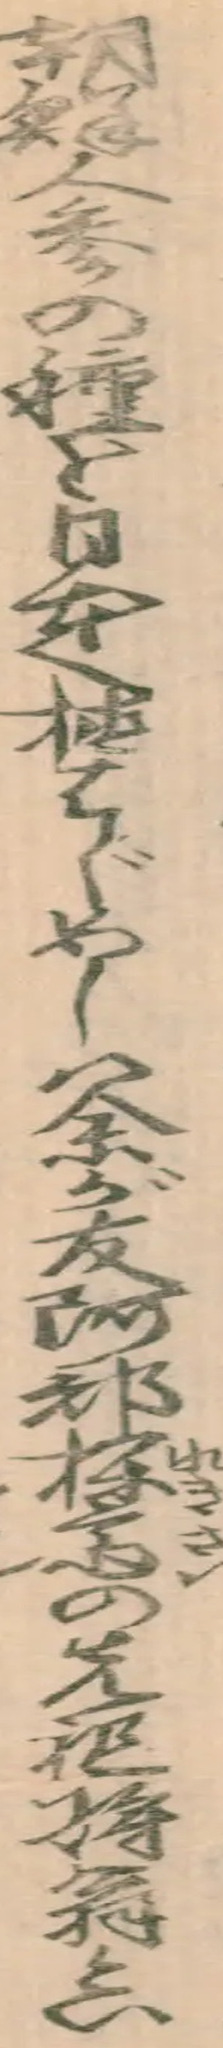朝鮮人参の種を日本へ植はじめしは余が友阿部櫟斎の先祖将翁とい
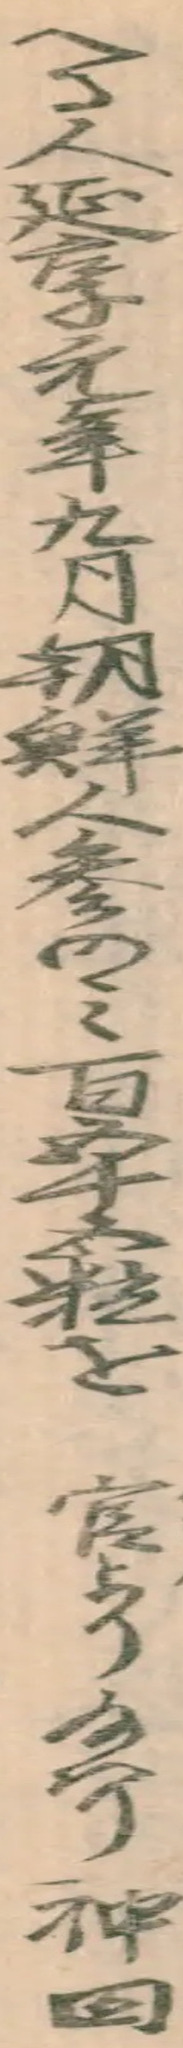へる人延享元年九月朝鮮人参のみ百五十五粒を官より給はり神田
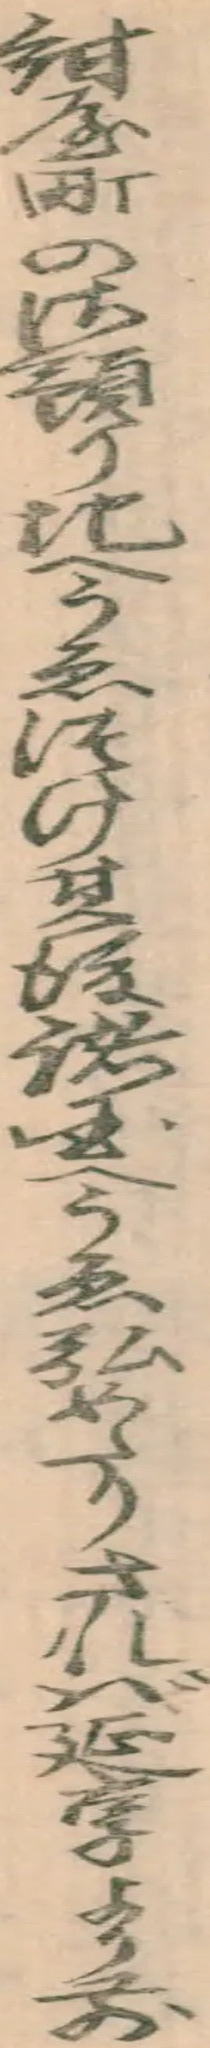紺屋町の御預り地へうゑつけ其後諸国へうゑ弘めたりされば延享より前
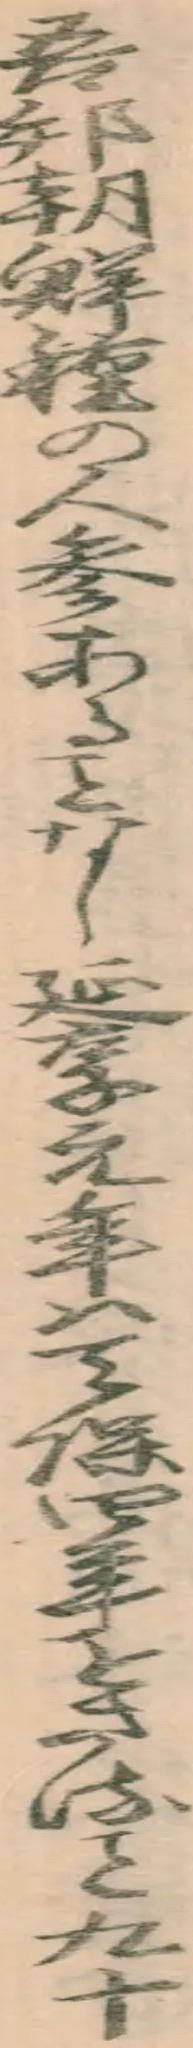吾邦朝鮮種の人参あることなし延享元年は天保四年をさること九十
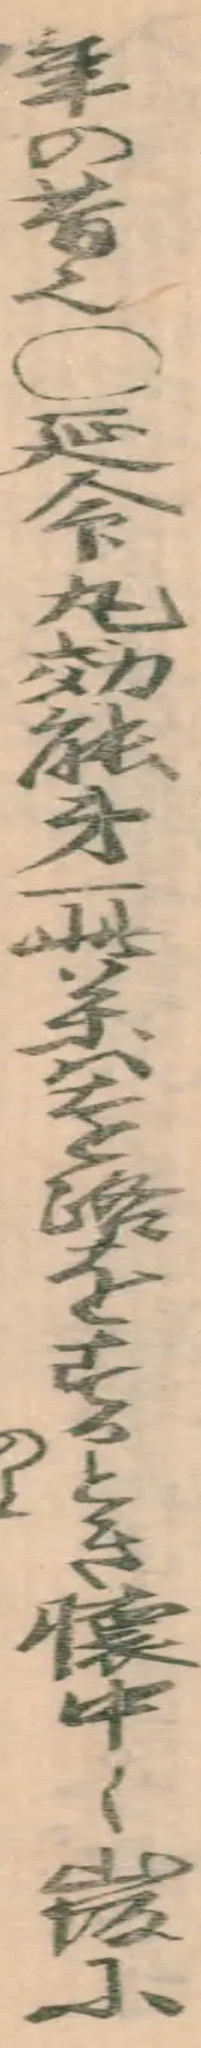年の昔也○延命丸効能第一此薬は遠路をするとき懐中し山坂に
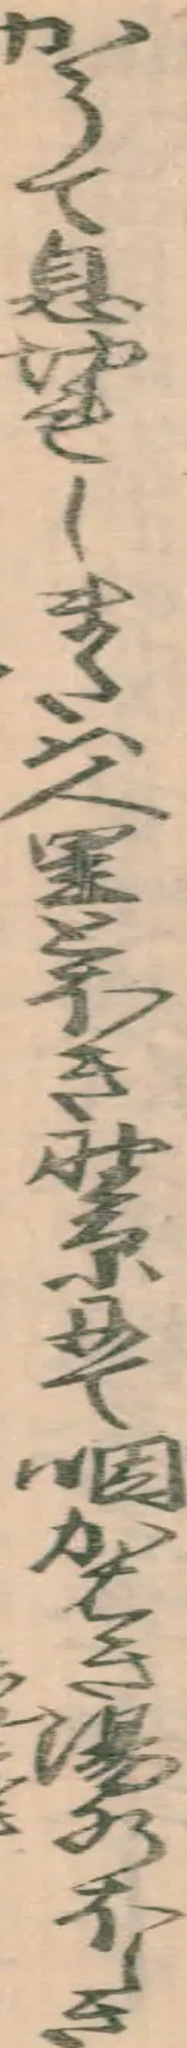かゝりて息切れしまたは人里とほき野原にて咽かはき湯水ほしき
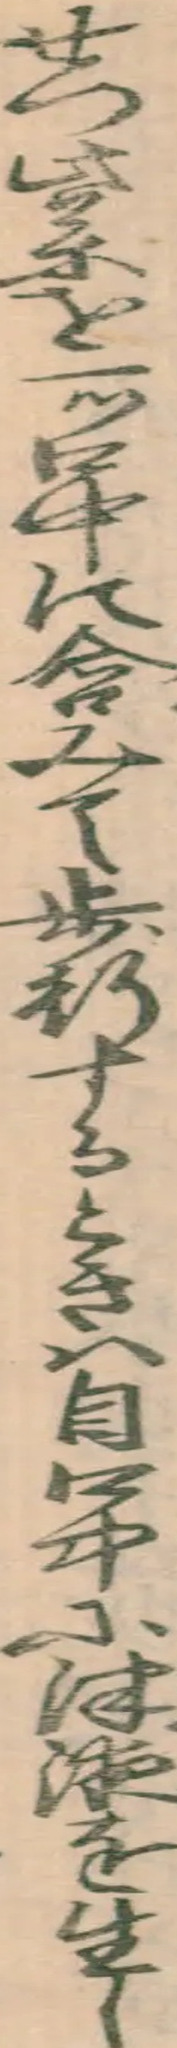せつ此薬を一ッ口中に含みて歩行するときは自口中に津液を生し
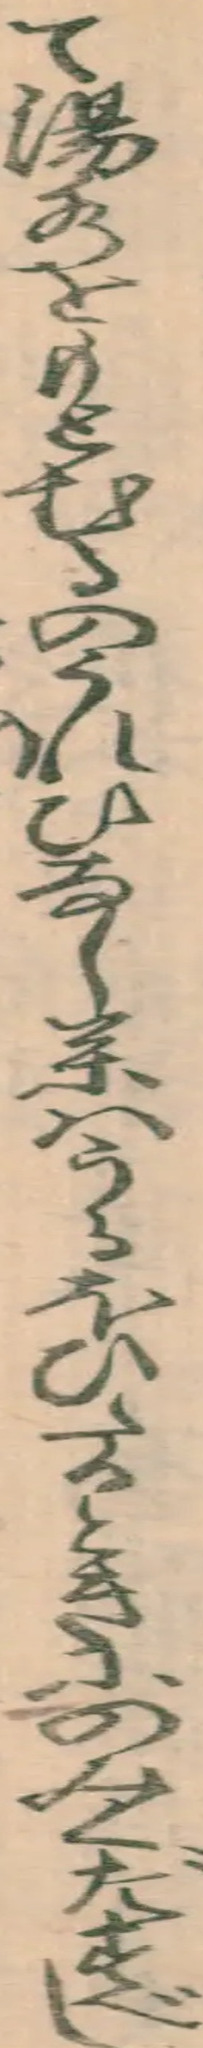て湯水をもとむるのうれひなし薬はうるほひたるときにのみくだすべし
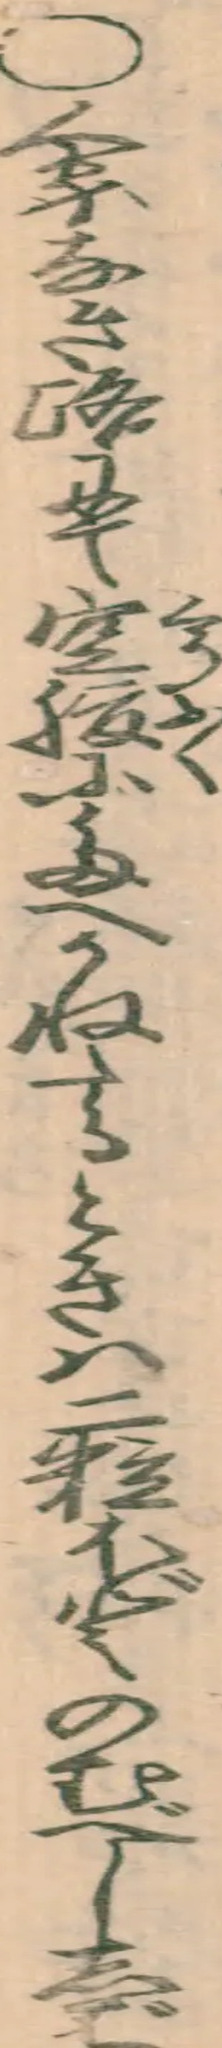○人家なき路にて空腹にたへかねたるときは二粒ほどのむべししば
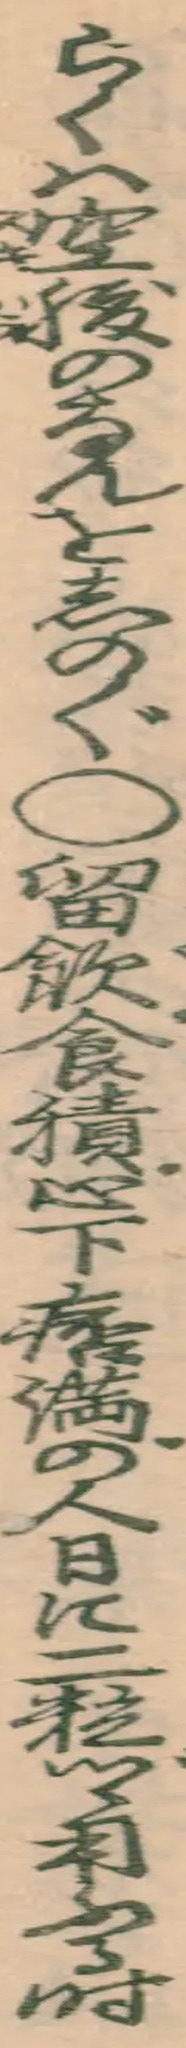らくは空腹のなんをしのぐ○留飲．食積．心下痞満．の人日に二粒づゝ用ふる時
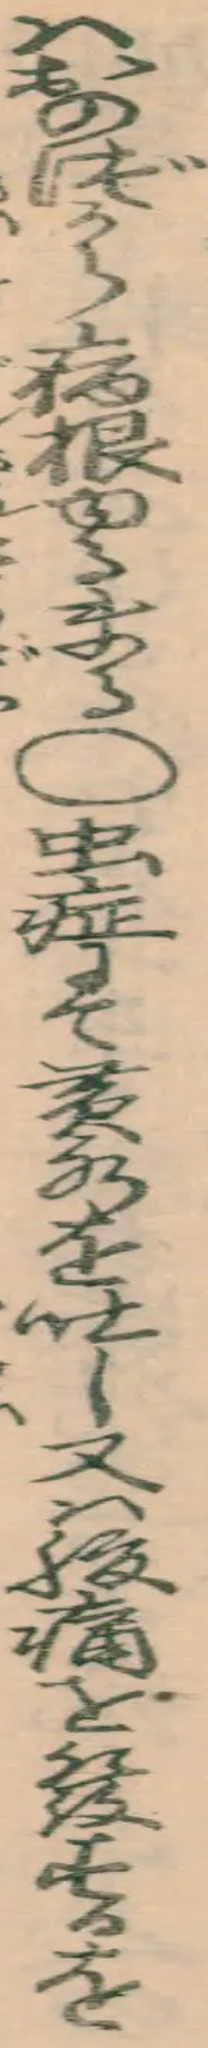はおのづから病根ゆるまる○虫症にて黄水を吐し又は腹痛を発するを
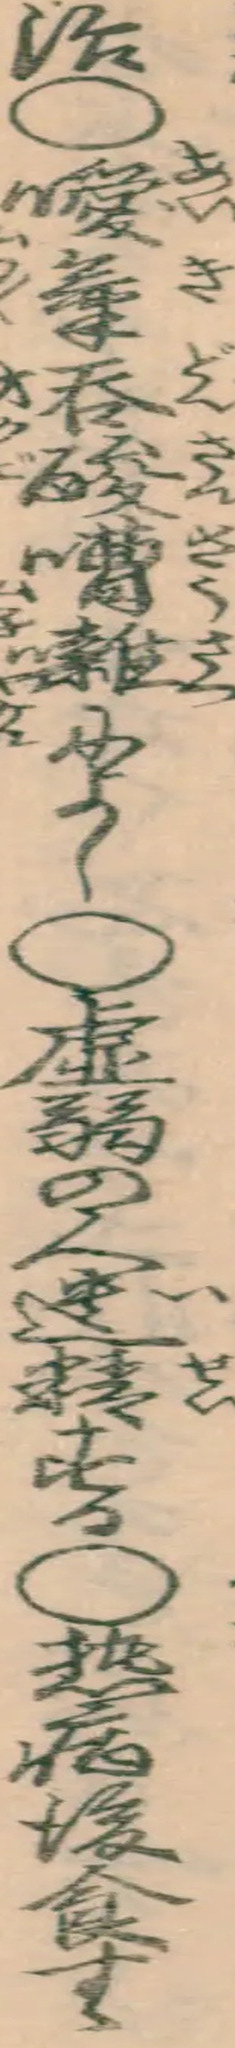治○噯気呑酸嘈囃によし○虚弱の人遺精する○熱病後食すゝ
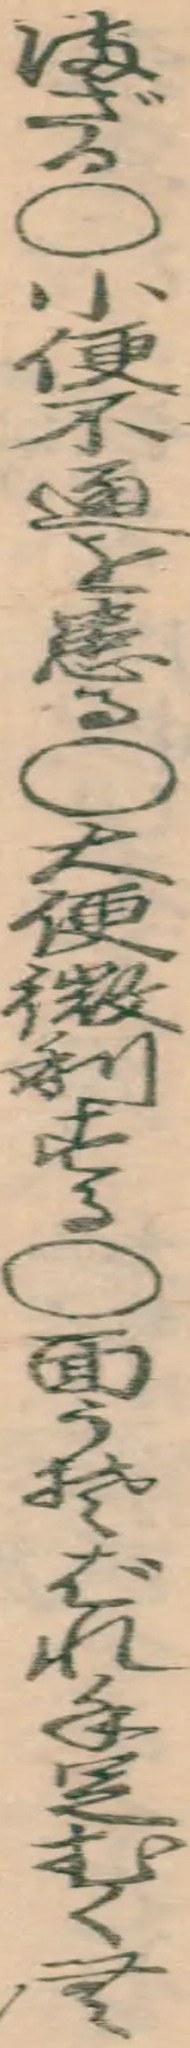まざる○小便不通を患る○大便微利する○面うそばれ手足むくむ
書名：日ごとの心得
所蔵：国立国会図書館 National Diet Library, JAPAN
